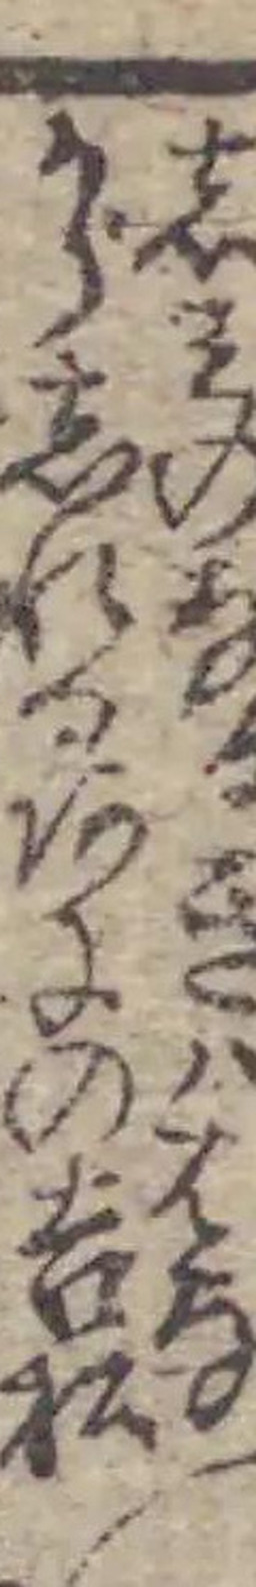からしれるあにの吉松
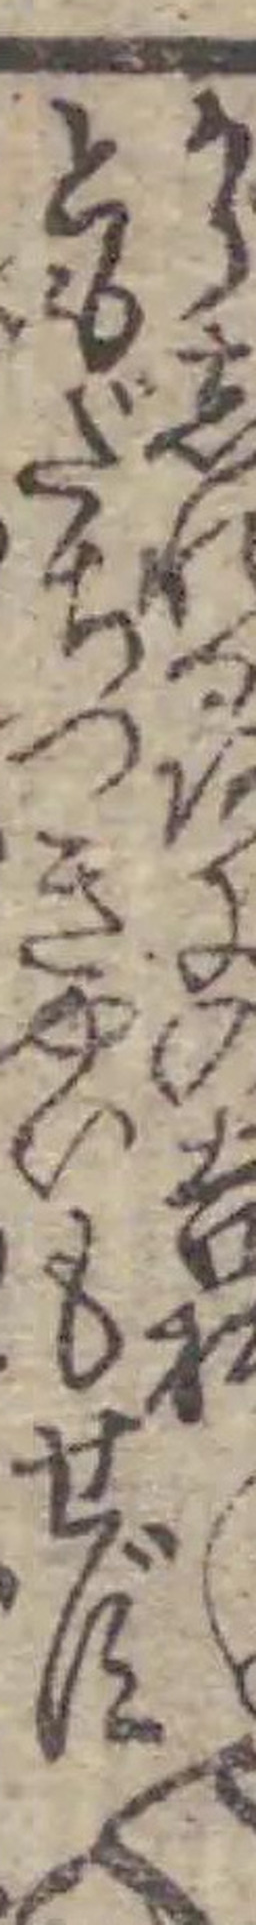ともだちつきやいもせず
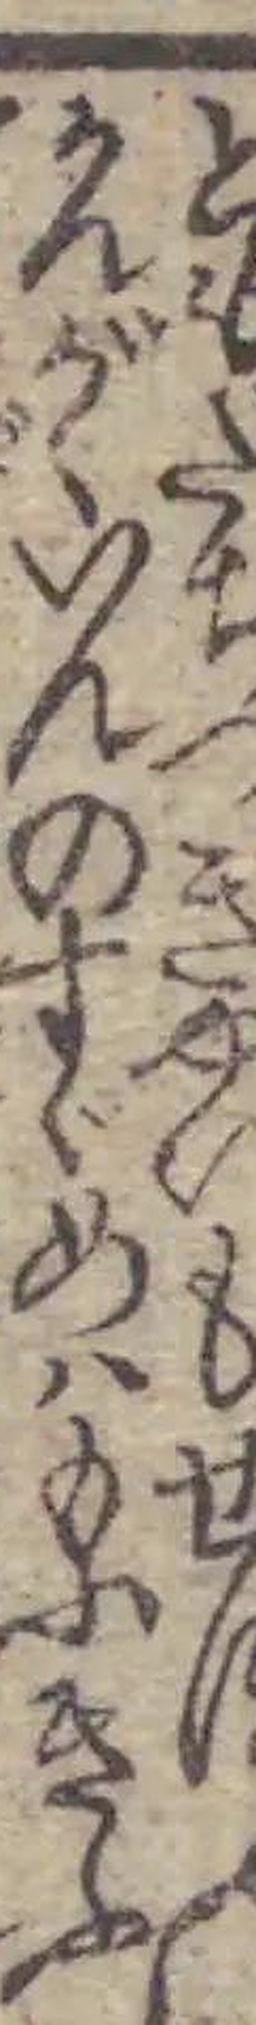かんがくいんのすゞめはもうきふ
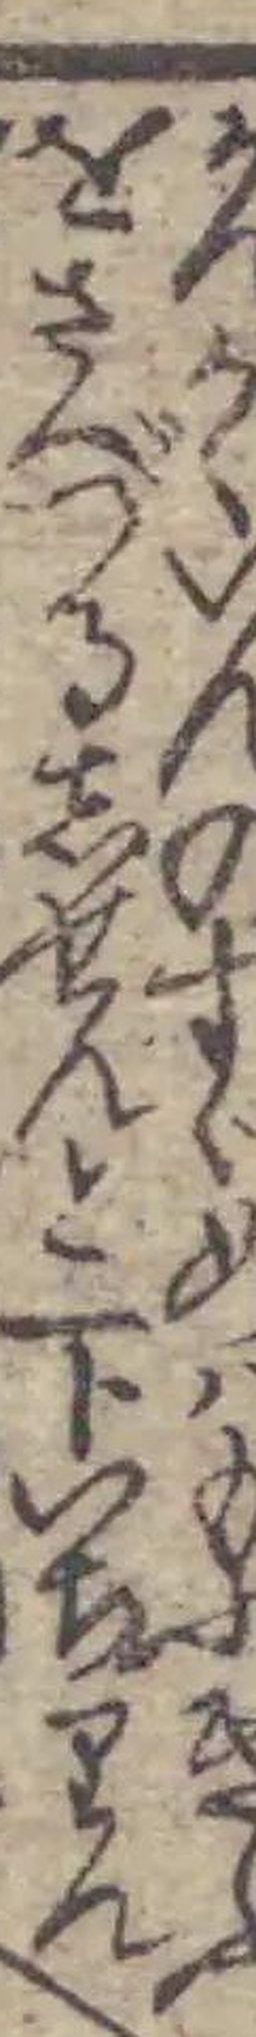をさへづるしせんと下いちりん
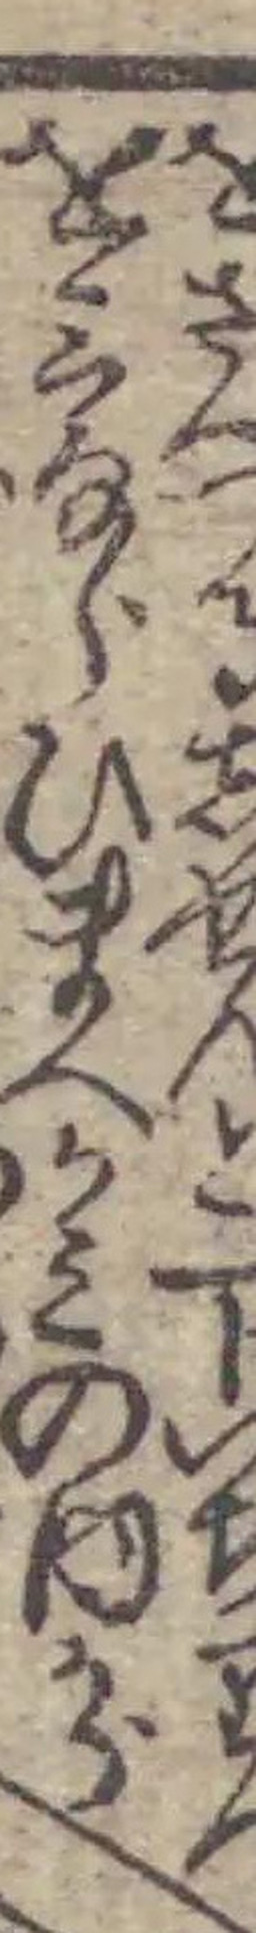をみならひまへかみの内から
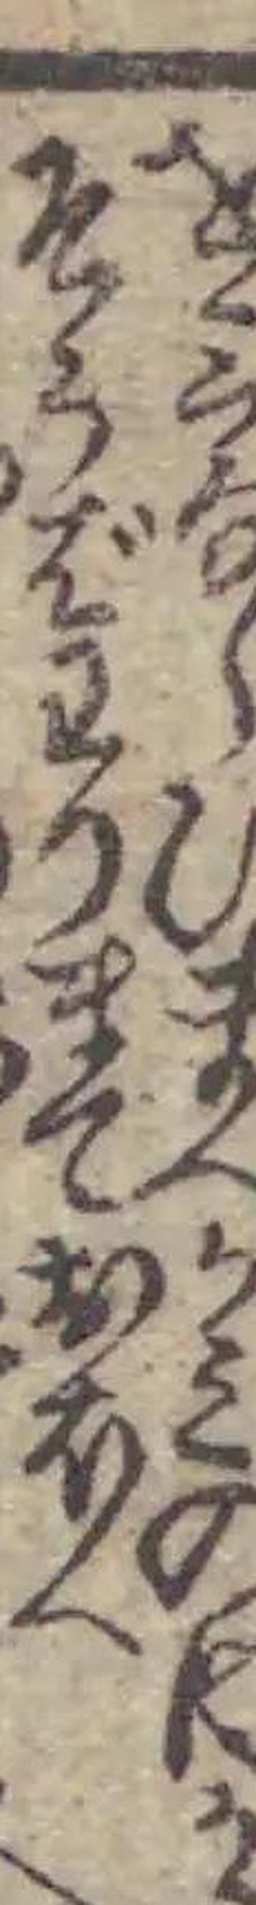そうばわりまておほへ
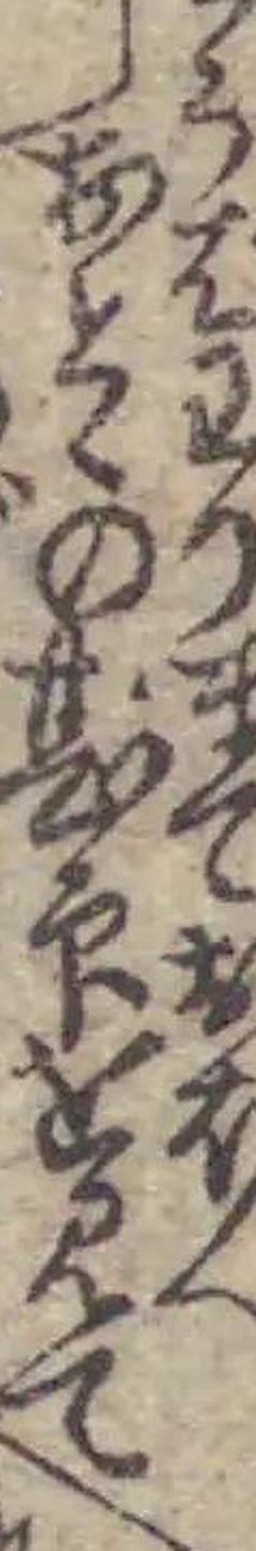おとゝの甚印を見て
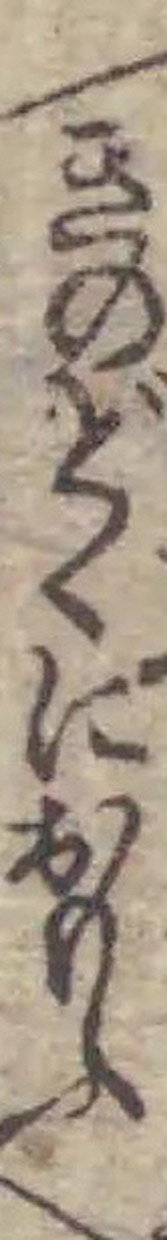きのどくにおもふ

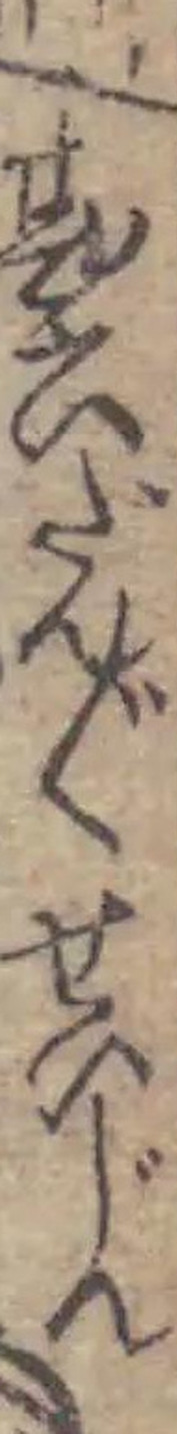甚六だん〴〵せいじん
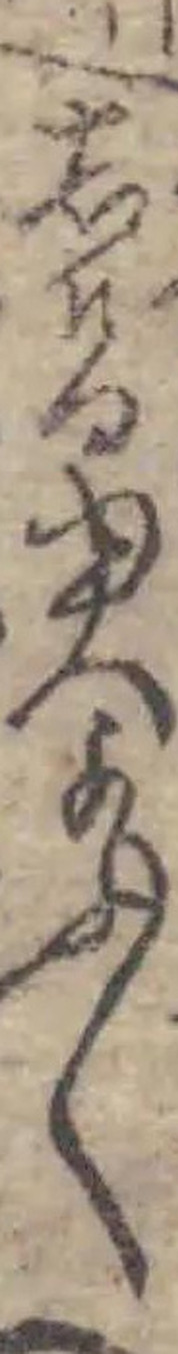しけるゆへよふ〳〵
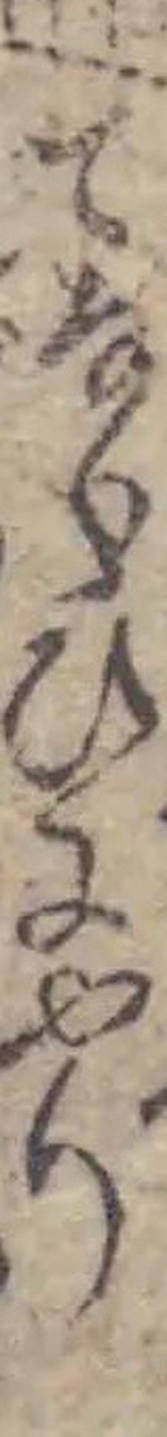てならひにやり
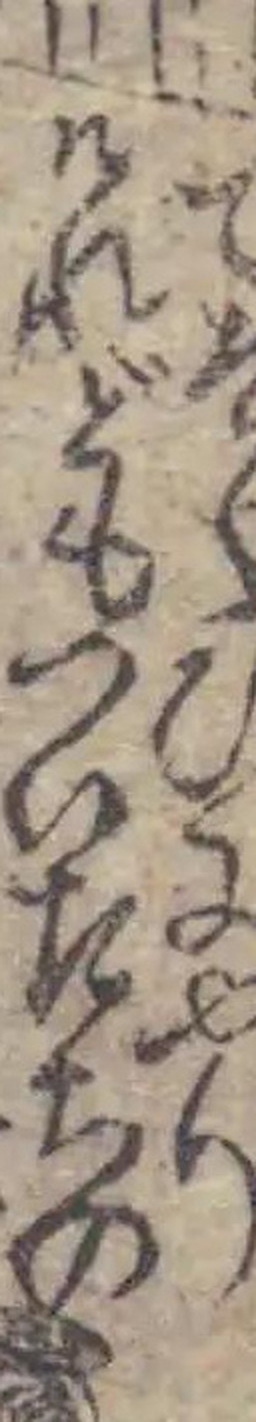けれどもついたちの
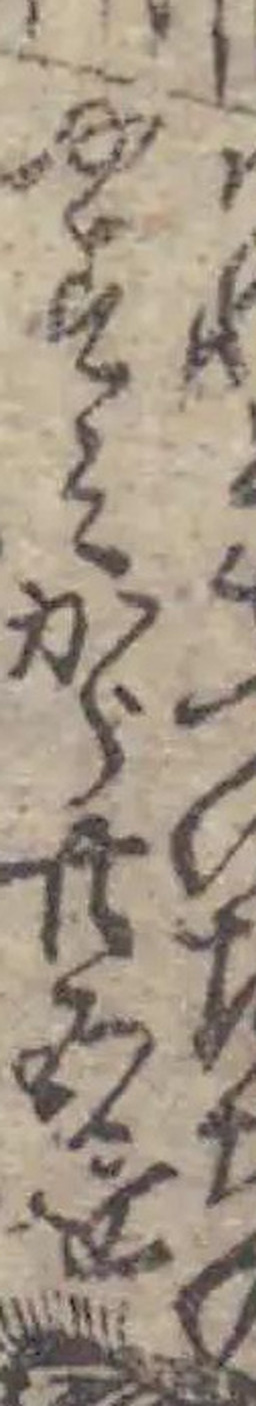やすみから廿五日を
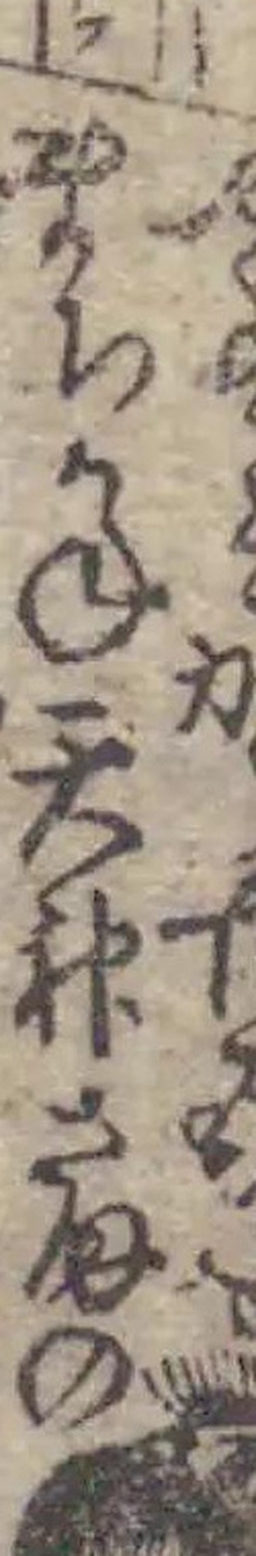まちかね天神さまの
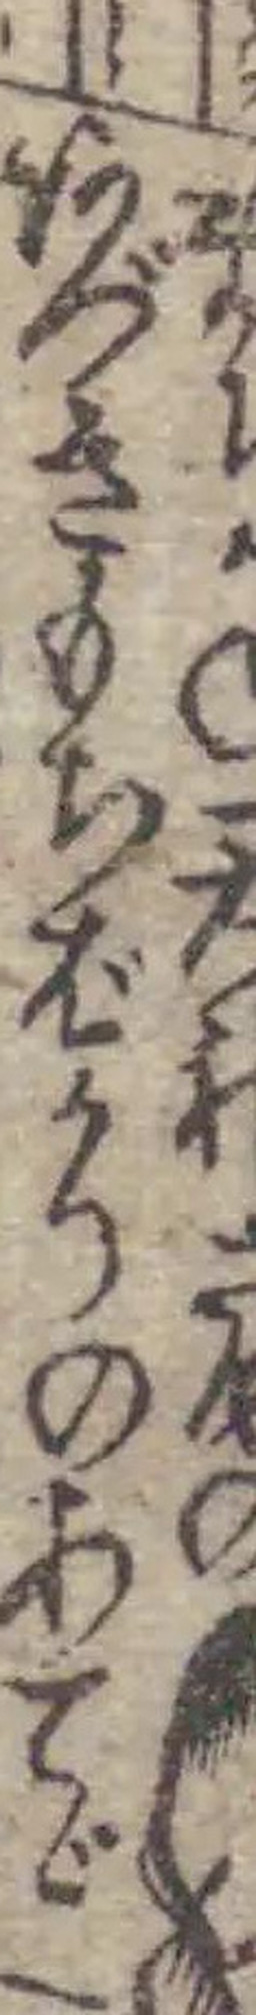あづきもちばかりのあてゞ
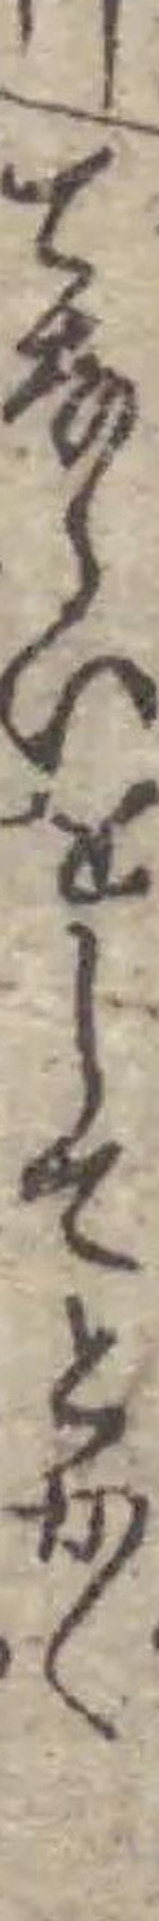てならいをしてとかく
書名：津以曽無弟の甚六 3巻
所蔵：国立国会図書館 National Diet Library, JAPAN
